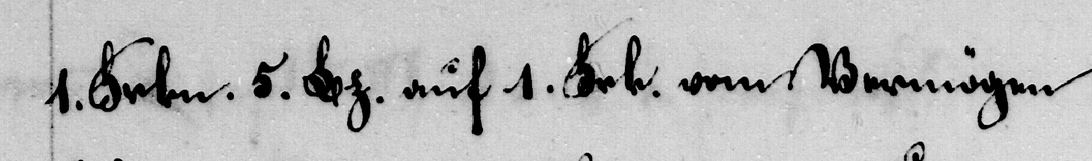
1. Frkn. 5. Bz. auf 1. Frk. vom Vermögen.
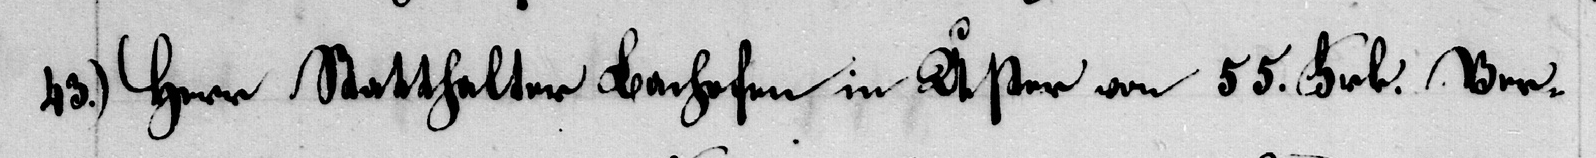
43.) Herr Statthalter Bachofen in Uster von 55. Frk. Ver¬
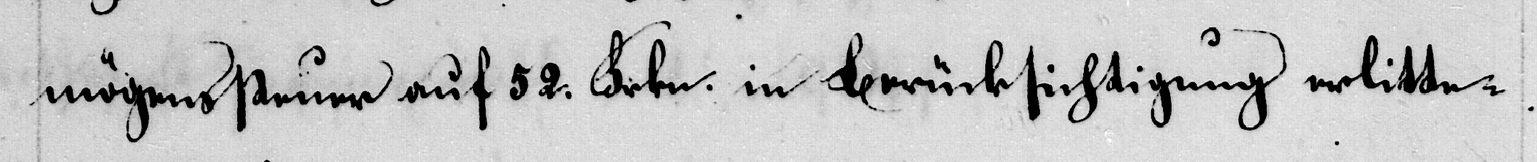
mögenssteuer auf 52. Frkn. in Berücksichtigung erlitte¬
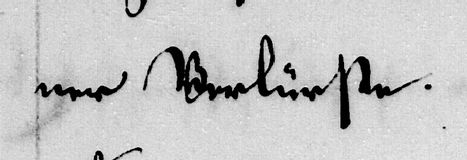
ner Verluste.
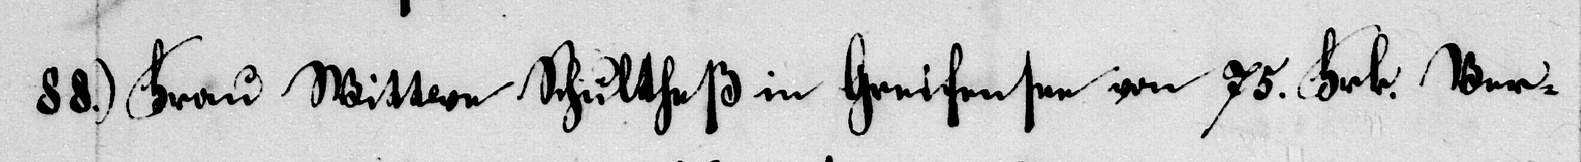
88.) Frau Wittwe Schultheß in Greifensee von 75. Frk. Ver¬
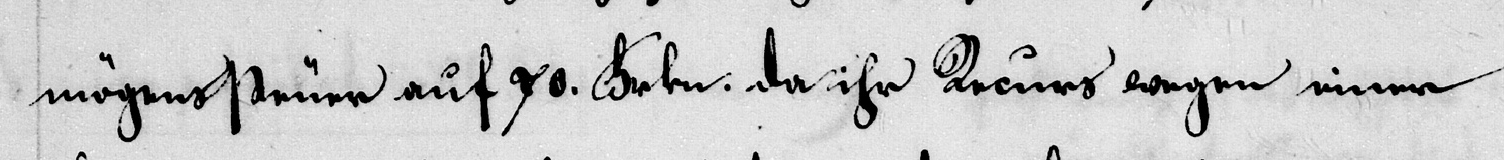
mögenssteuer auf 70. Frkn. da ihr Recurs wegen einer
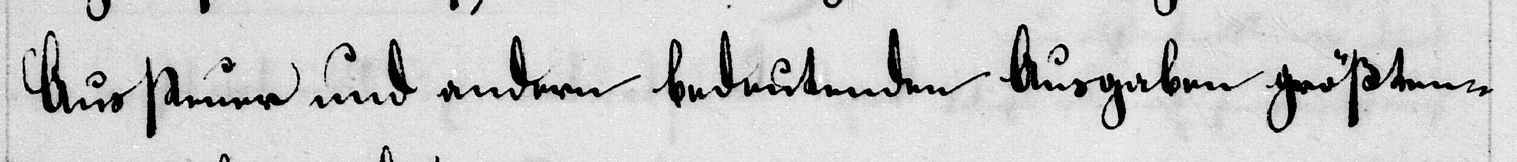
Aussteuer und andern bedeutenden Ausgaben größten¬
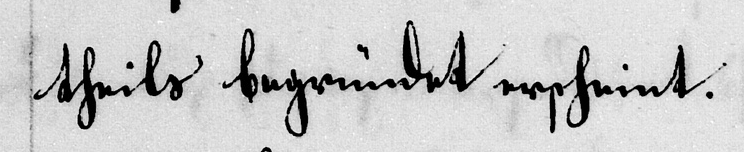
theils begründet erscheint.
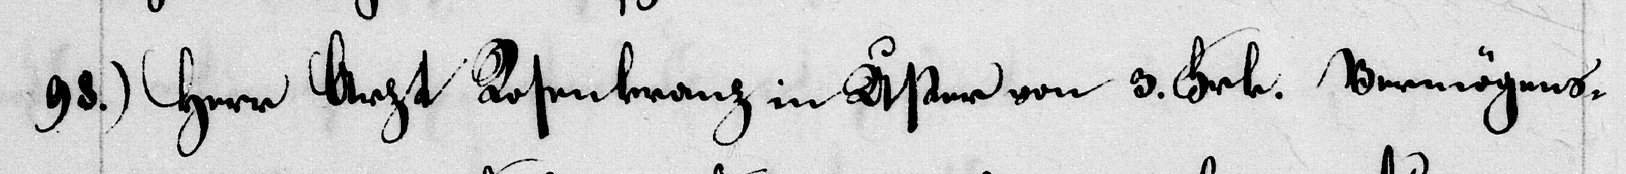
98.) Herr Arzt Rosenkranz in Uster von 3. Frk. Vermögens¬
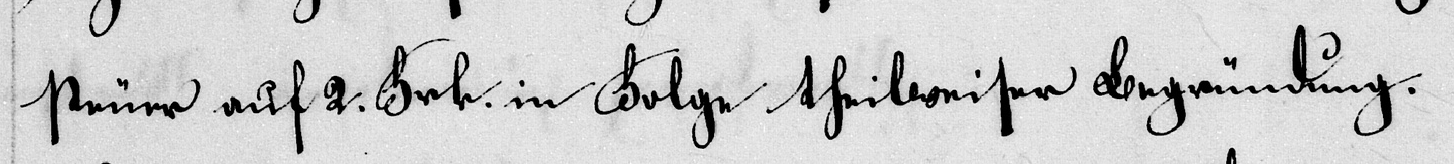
steuer auf 2. Frk. in Folge theilweiser Begründung.
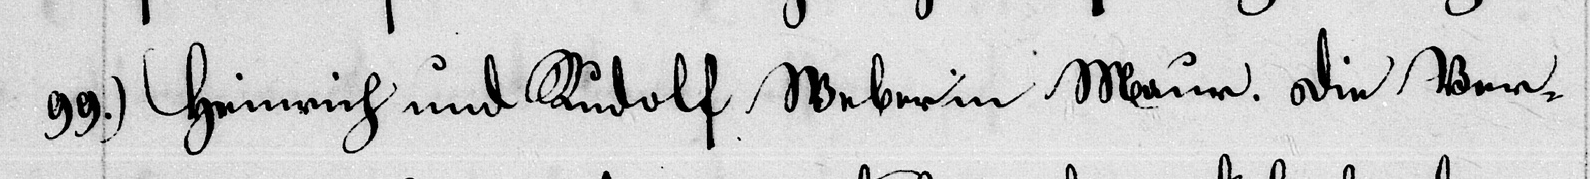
99.) Heinrich und Rudolf Weber in Maur. Die Ver¬
